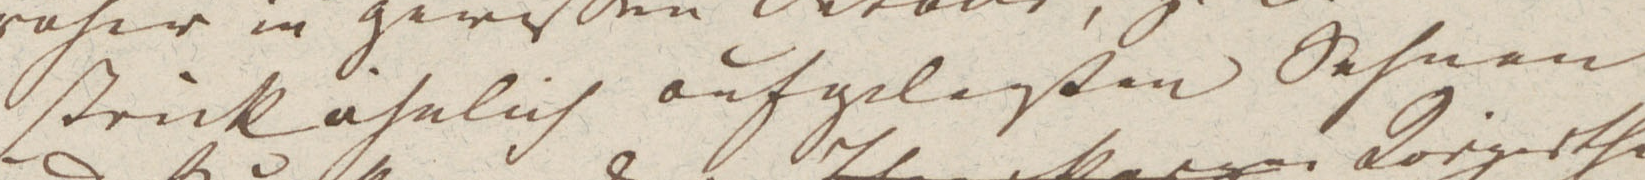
strickähnlich aufgelegten Sehnen
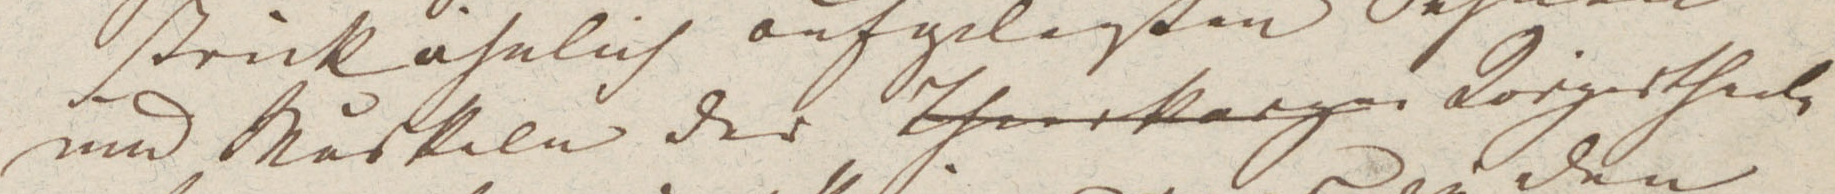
und Muskeln der Thierkorper Körpertheile
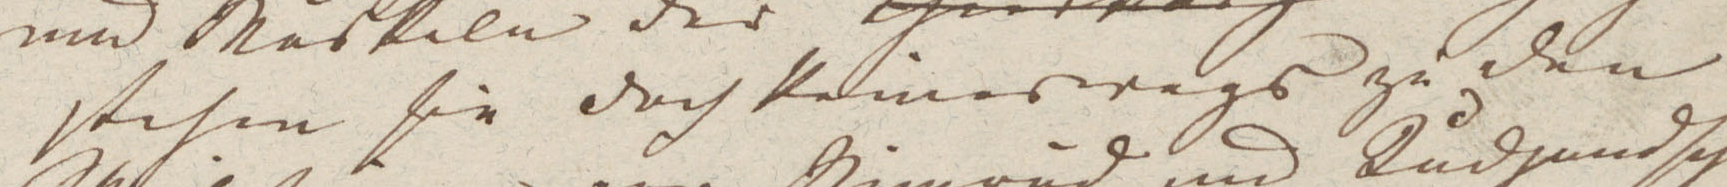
stehen sie doch keineswegs zu den
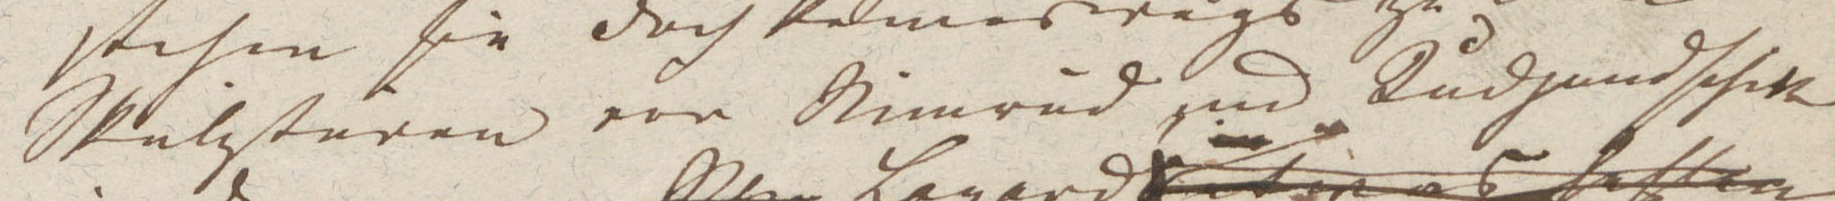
Skulpturen von Nimrud und Kudjundschik
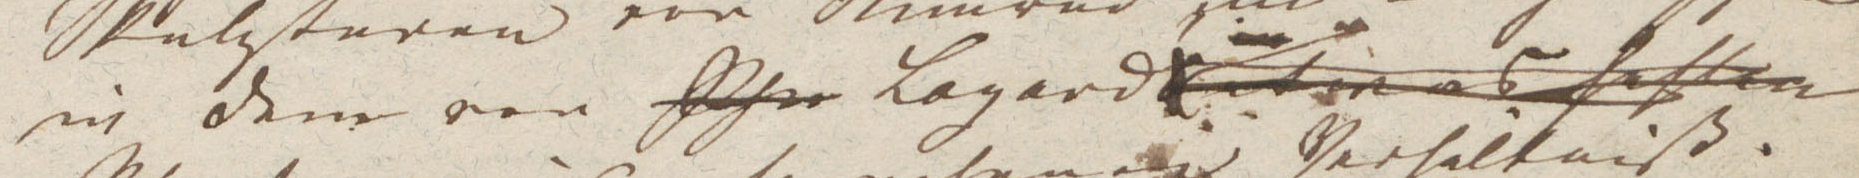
in dem von Ph Layard in etwas ahlen
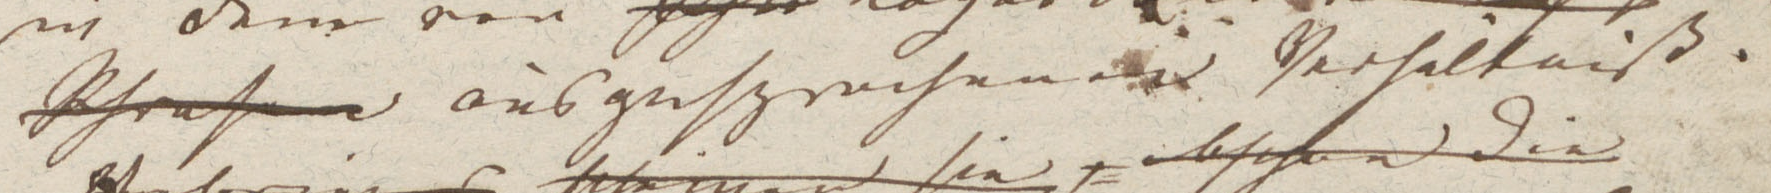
Phrasen ausgesprochenen Verhältniss.
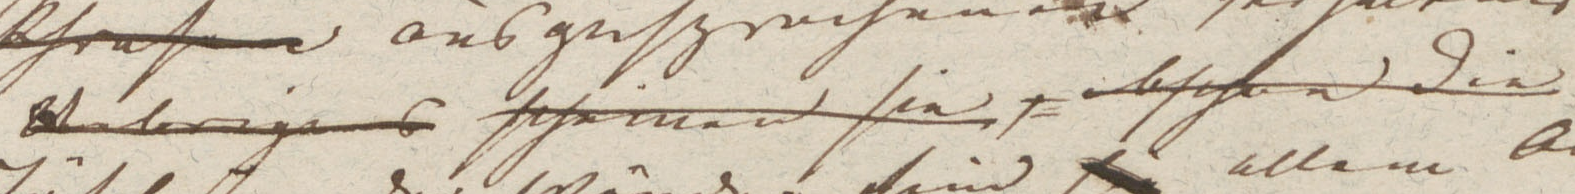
Uebrigens scheinen sie, obschon die
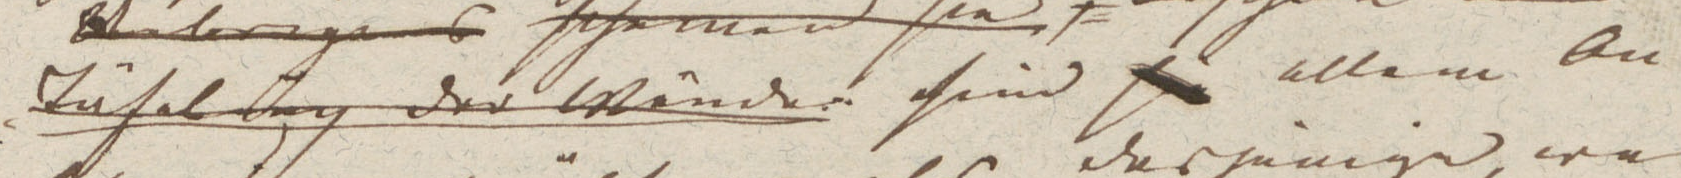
Täfelung der Wände sind sie allem An-
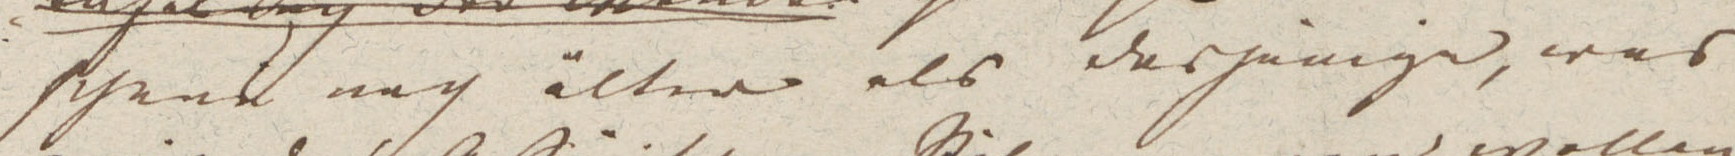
schein nach älter als dasjenige, was
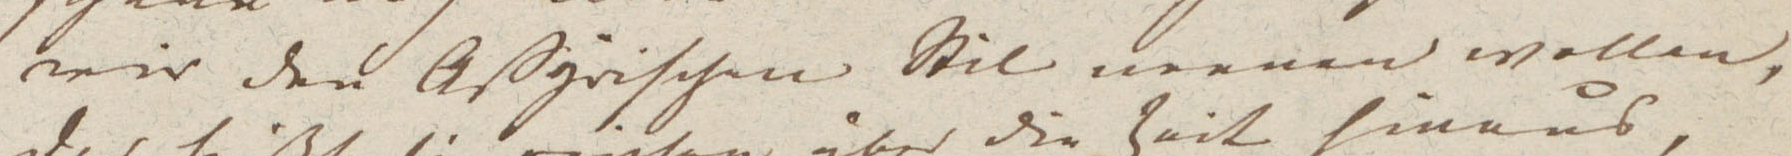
wir den Assyrischen Stil nennen wollen,
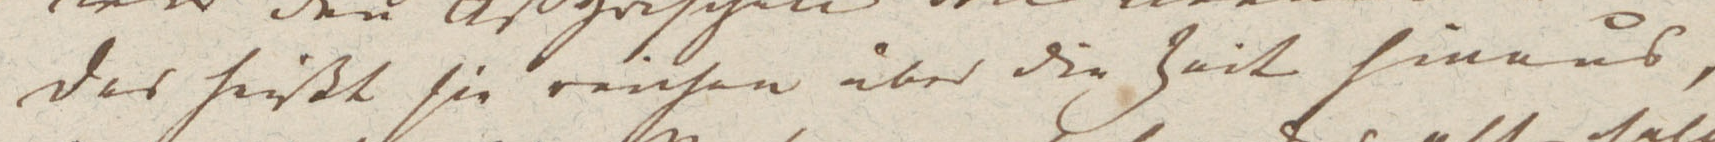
das heisst sie reichen über die Zeit hinaus,
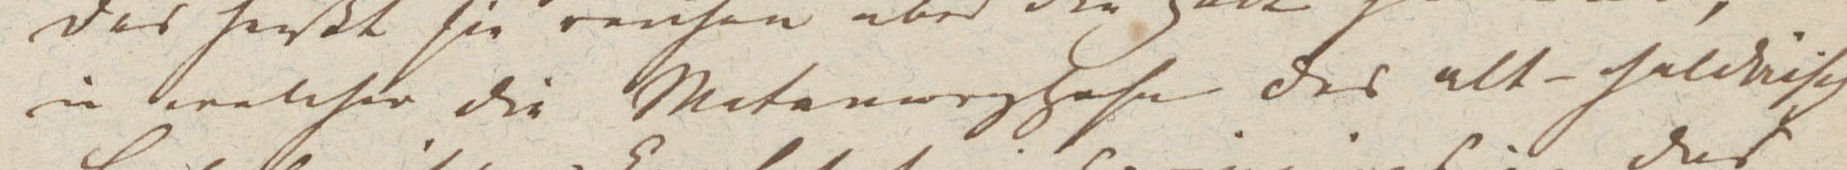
in welcher die Metamorphose des alt-chaldäisch
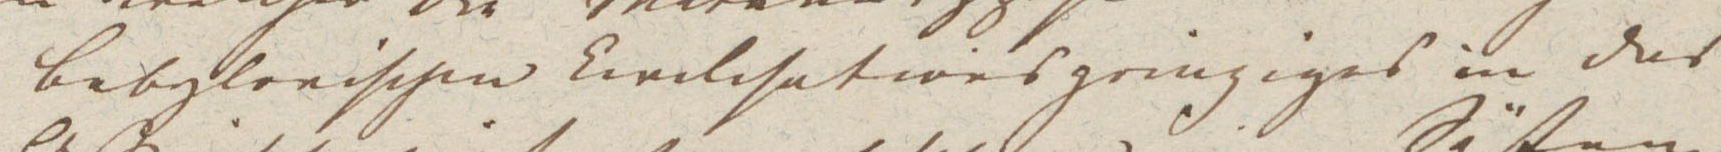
Babylonischen Civilisationsprinzipes in das
